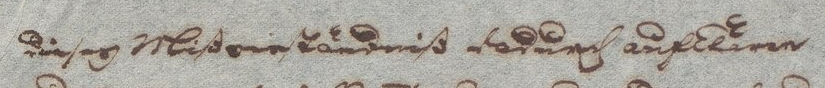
dieses Mißverständniß dadurch aufklären
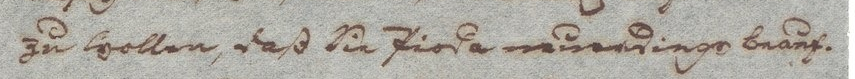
zu wollen, daß Sie Pioda neuerdings beauf-
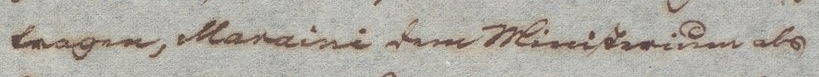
tragen, Maraini dem Ministerium als
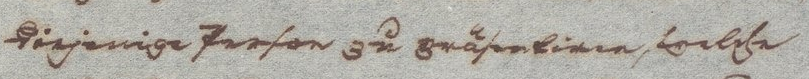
diejenige Person zu präsentiren, welche
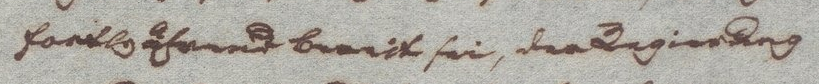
fortwährend bereit sei, der Regierung
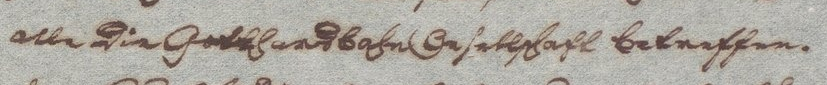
alle die Gotthardbahn Gesellschaft betreffen-
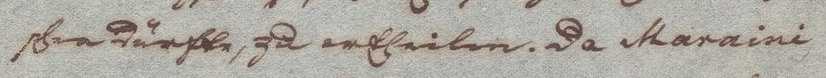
schen dürfte, zu ertheilen. Da Maraini
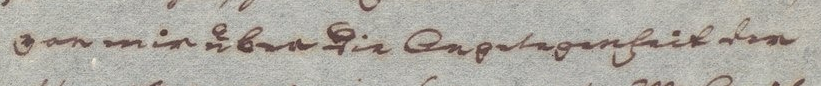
von mir über die Angelegenheit der
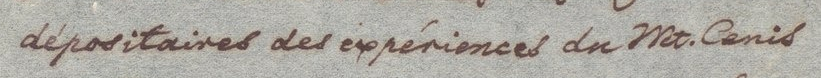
dépositaires des expériences du Mt. Cenis
